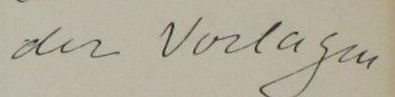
der Vorlagen
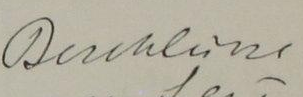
Beschlüsse
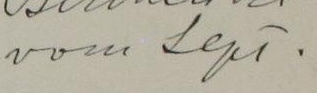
vom Sept
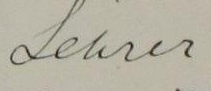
Lehrer
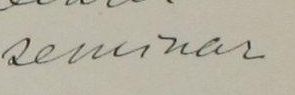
seminar
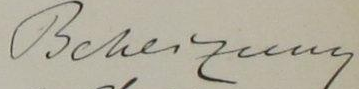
Beheizung
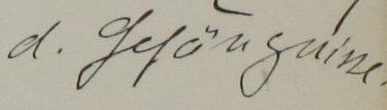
d. Gefängnisse
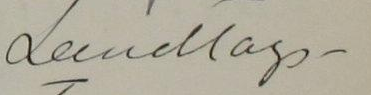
Landtags.
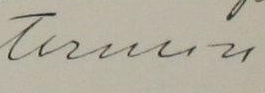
termin
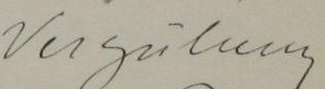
Vergütung
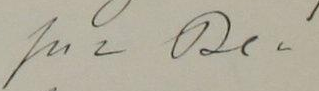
für Be-
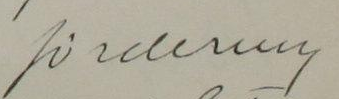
förderung
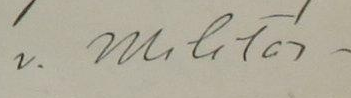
v. Militär
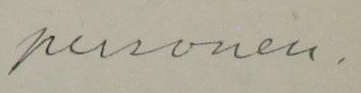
personen
